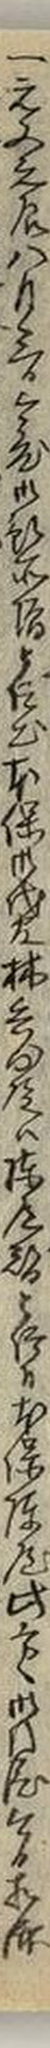一元文元辰八月三日今度御預所増被仰出本保御代官林兵右衛門殿ハ陣屋替被仰付本保陣屋此方へ御引渡今日相済
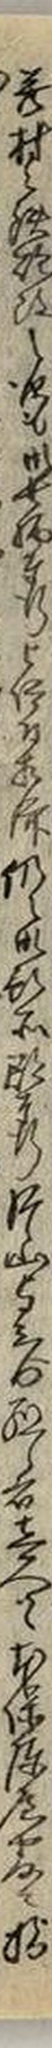幷村々鉄炮改之儀も御長柄奉行被仰付相済仍之御預所郡奉行片山与三右衛門組之者壱人ツヽ本保陣屋番ニ指
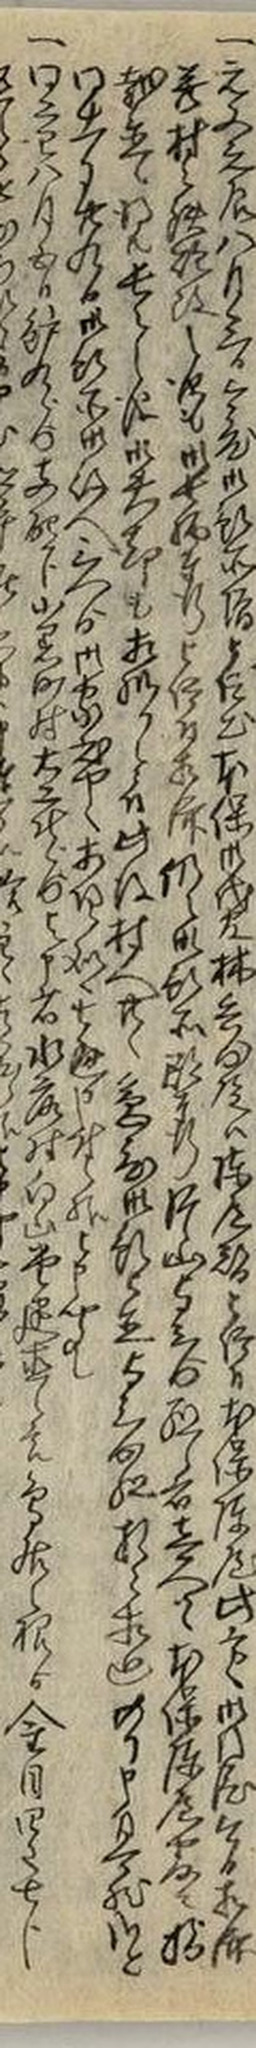越置候得共長々之儀御失却も相掛り候ニ付此後村人共へ急度御預被置与三右衛門組折々相廻〆り申付可然哉と
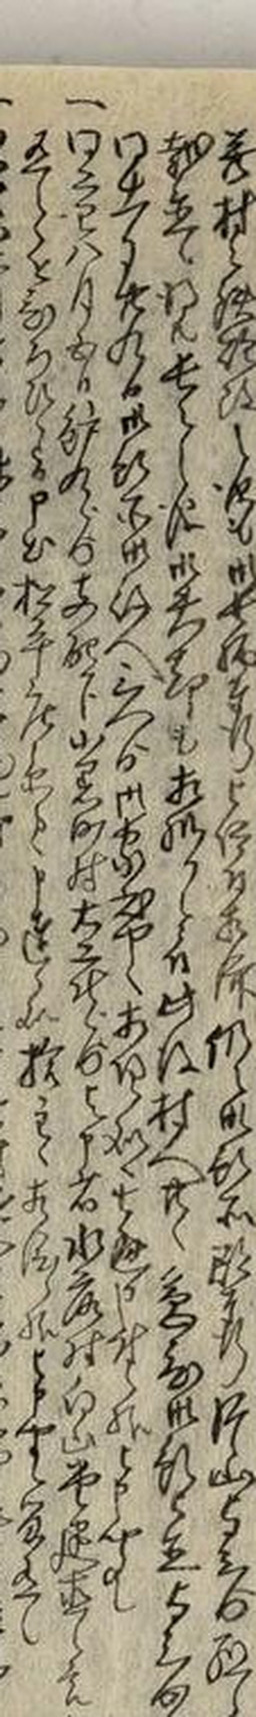同十一月廿九日御預所御役人三人ゟ御家老中へ相伺候処へ右通申付候様被申聞候
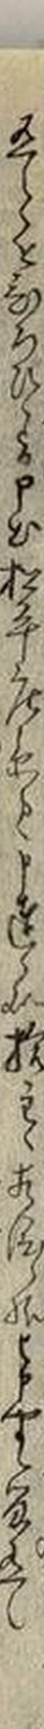有之候をひろひ候旨申出松平庄兵衛へ申達候処拾主へ相渡候様被申聞候留有之
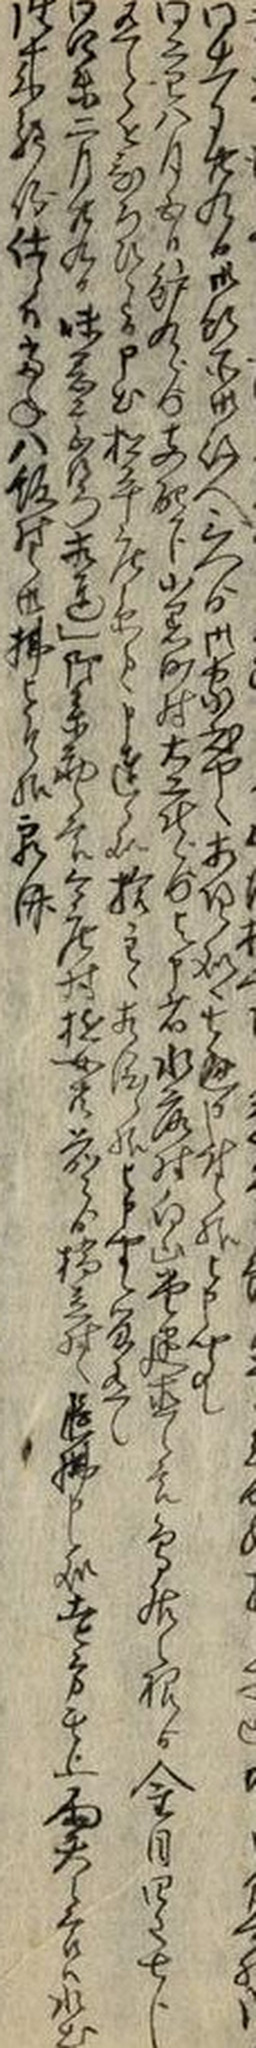有之候をひろひ候旨申出松平庄兵衛へ申達候処拾主へ相渡候様被申聞候留有之
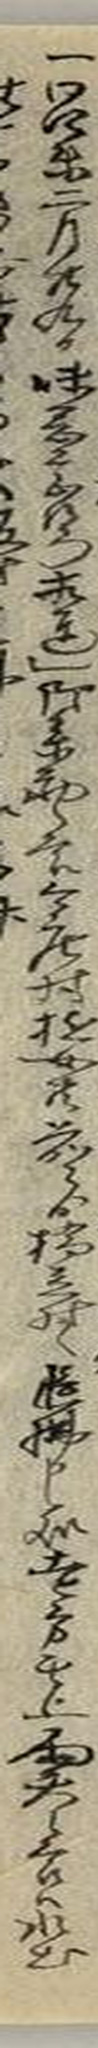一同四未二月廿九日味岡甚左衛門相達」御参勤之節今庄村遊女共前々ゟ橋立村へ追払申候処遠方其上雨天之節ハ水出
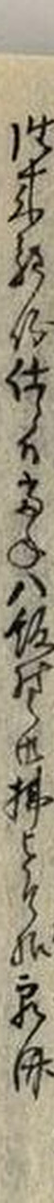往来難儀仕候ニ付当年八飯村へ御払被下候様願済
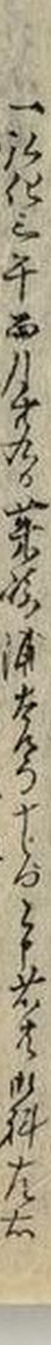一弘化三午正月廿九日茱崎浦太左衛門十郎右衛門と申者共御料左右
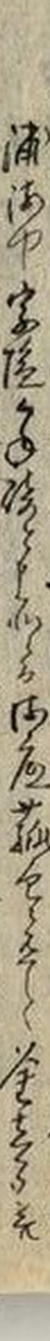浦海中字塩かね崎と申所ニ而海底菰包ニ有之候釜さる幷
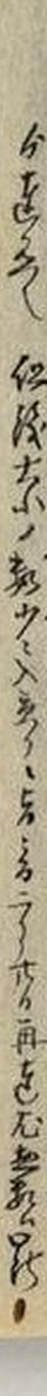ゟ達有之但銭大小ノ数少々入交り候旨ニ而二月廿日再達尤惣数ハ同断
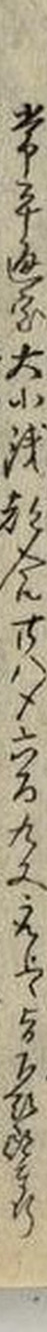常平通宝大小銭都合廿八〆六百九文取上候旨下領郡奉行

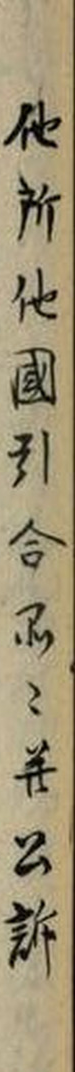他所他国引合品々幷公訴
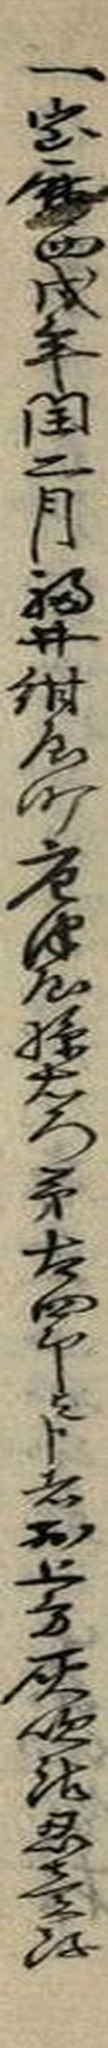一宝暦四戌年閏二月福井紺屋町唐津屋孫右衛門弟太四郎与申者於上方灰吹銀忍売致
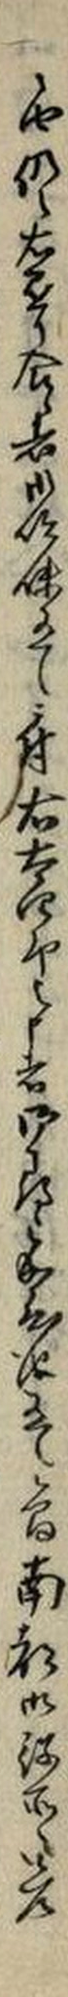候由仍之右懸り合候者御吟味有之ニ付右太四郎与申者御尋被成度儀有之候間南都御役所へ差
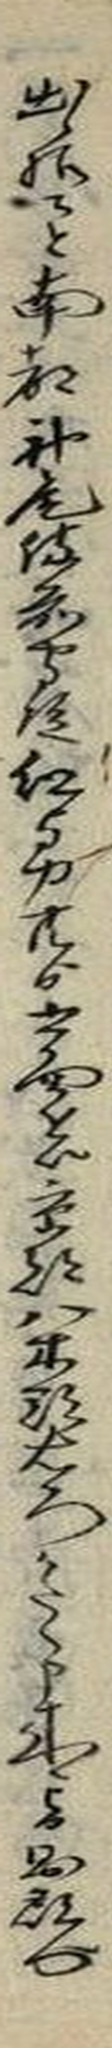出候様ニと南都神尾備前守殿組与力共ゟ書面を以京都八木郡右衛門かたへ申来候旨則郡右衛門
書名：御国他国諸事之部
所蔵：福井県文書館 Fukui Prefectural Archives
